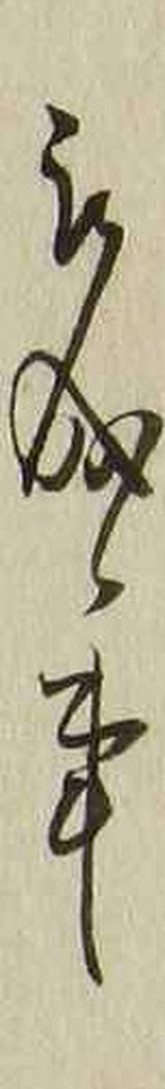被成候事
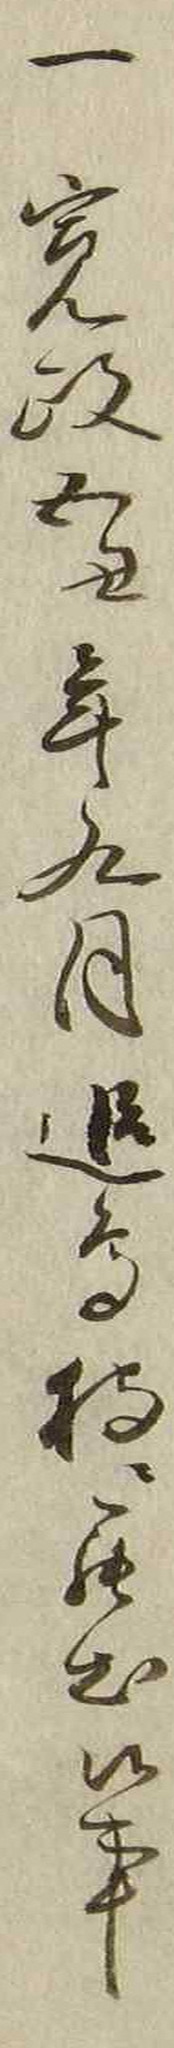一寛政五丑年九月追鳥狩ニ罷出候事
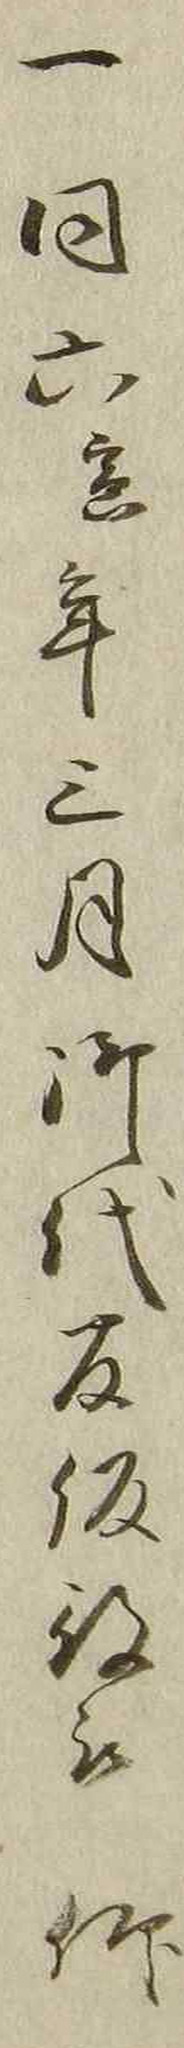一同六寅年三月御代官仮役被仰
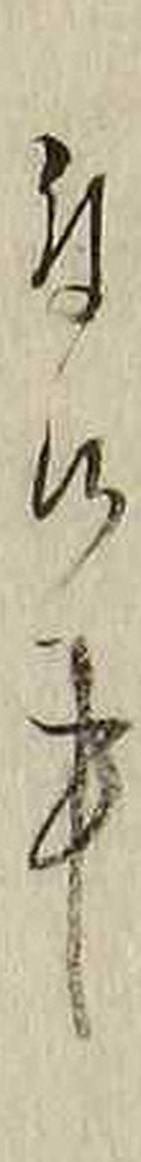付候事
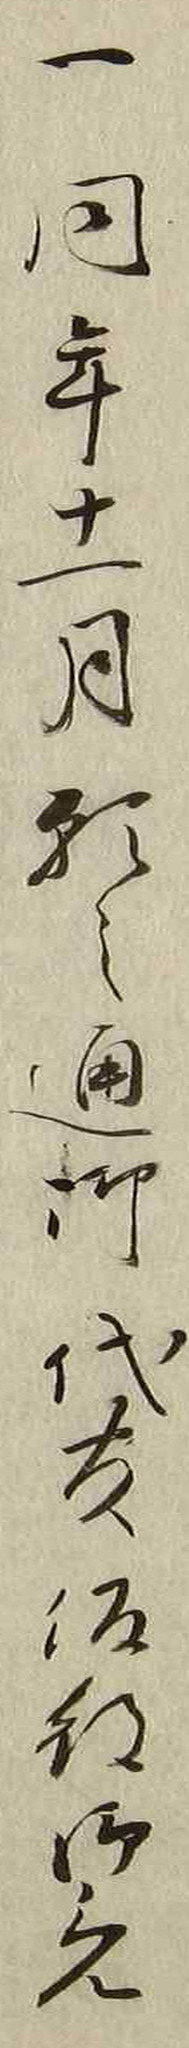一同年十一月願之通御代官仮役御免
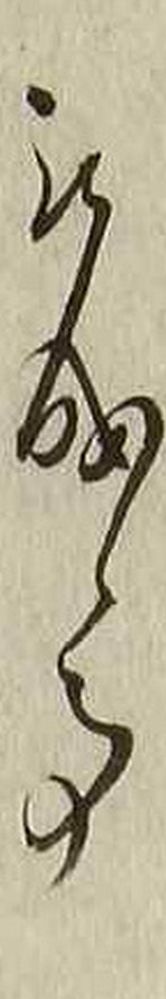被成候事
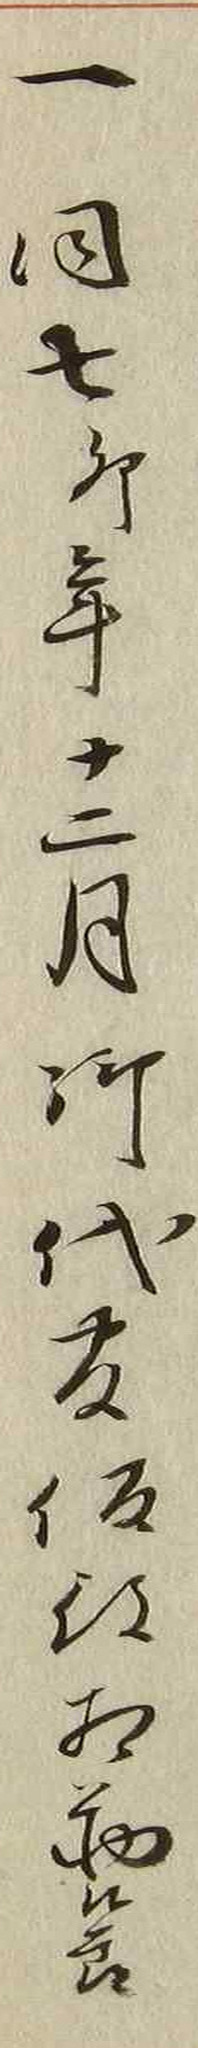一同七卯年十二月御代官仮役相勤候節
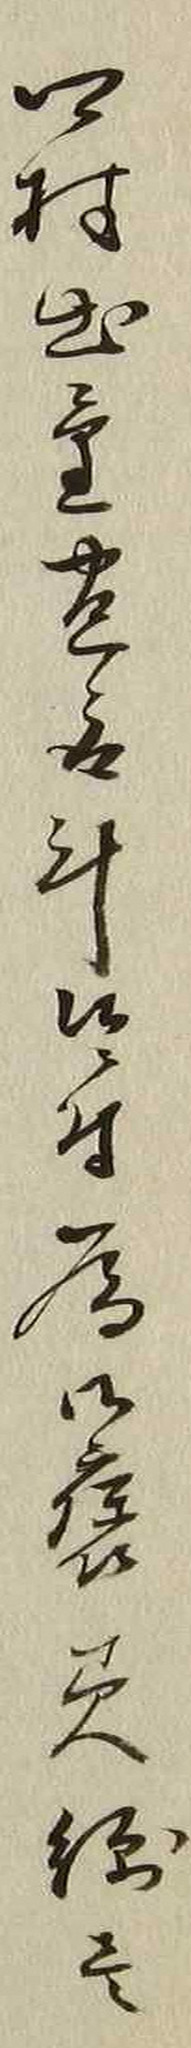郷村出金宜取計候ニ付為御褒美綿壱
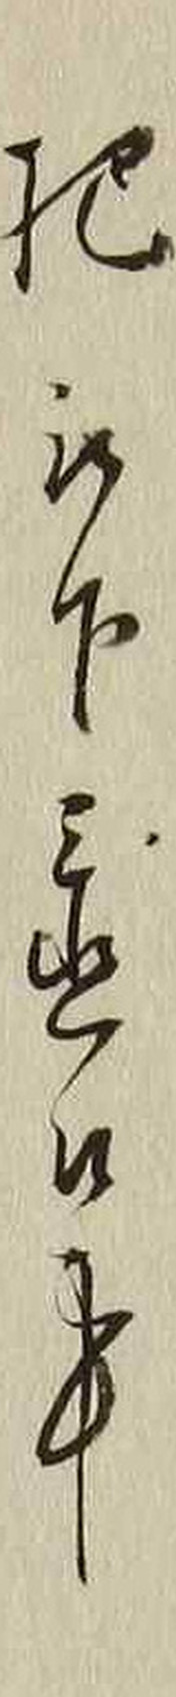把被下置候事
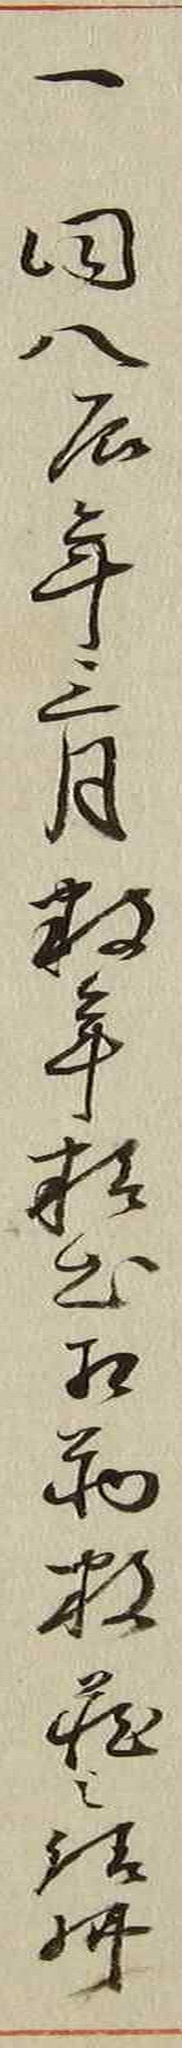一同八辰年三月数年精出相勤数蔵之請払
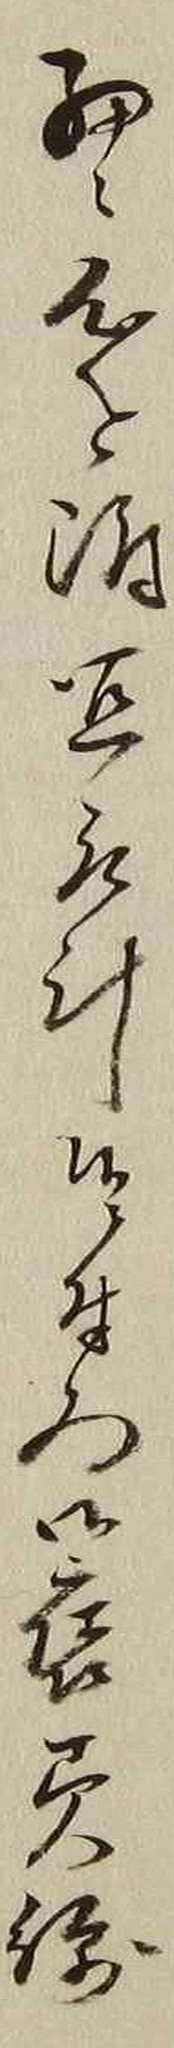細々心を附宜取計候ニ付為御褒美綿
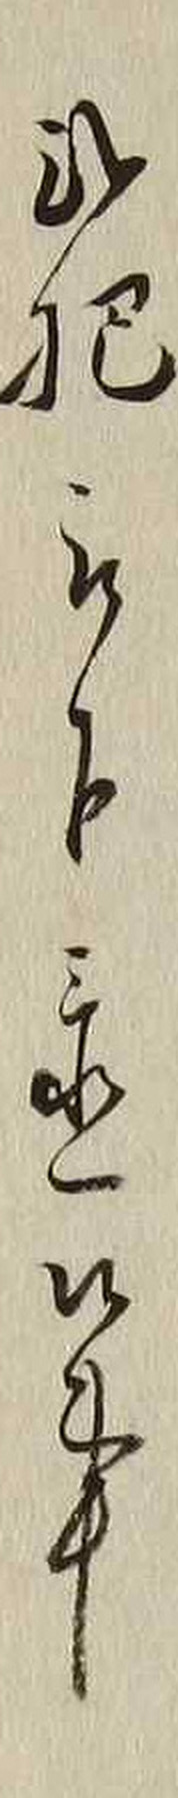弐把被下置候事
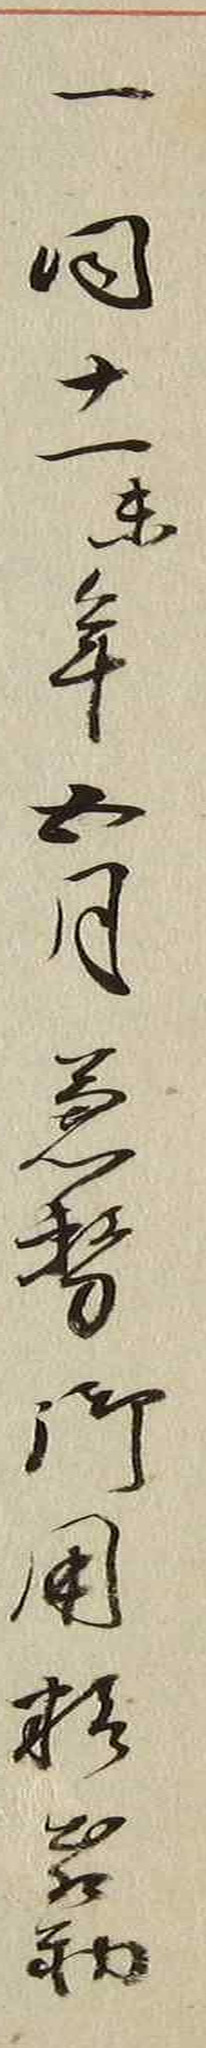一同十一未年五月兼務御用精出相勤
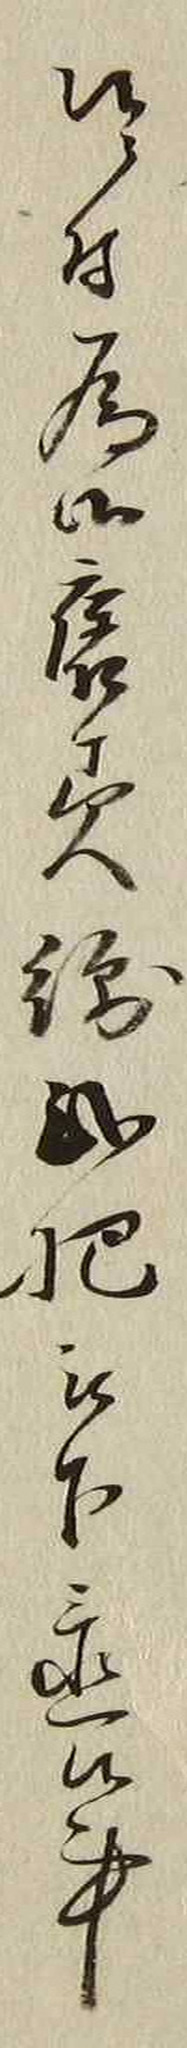候ニ付為御褒美綿弐把被下置候事
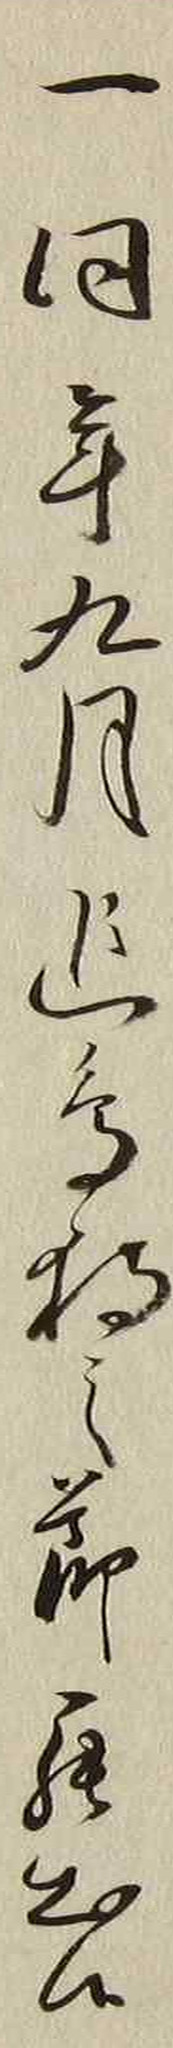一同年九月追鳥狩之節罷出候
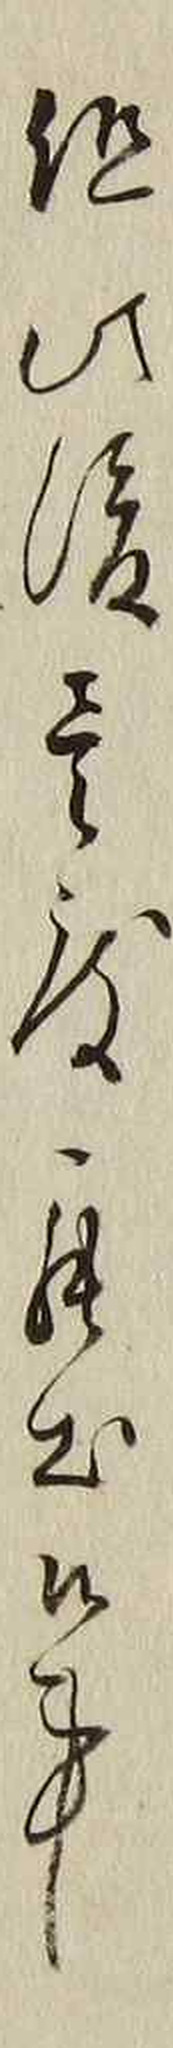但此後壱度罷出候事
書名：諸士系譜　巻之25　い之部25
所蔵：会津若松市立会津図書館
